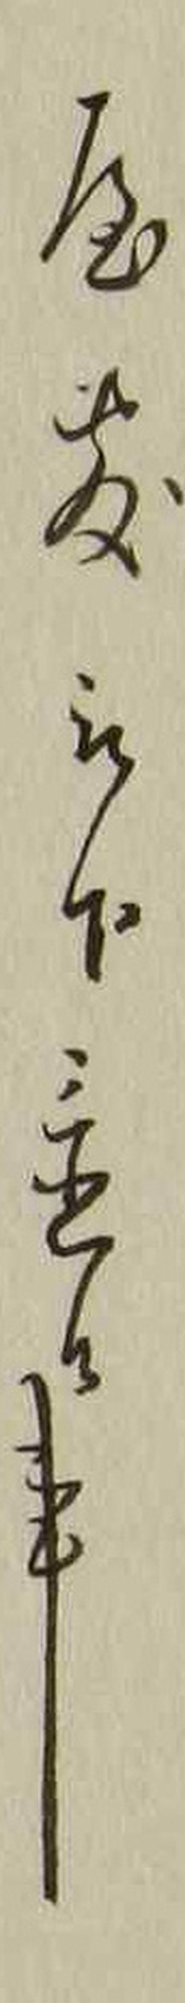屋敷被下置候事
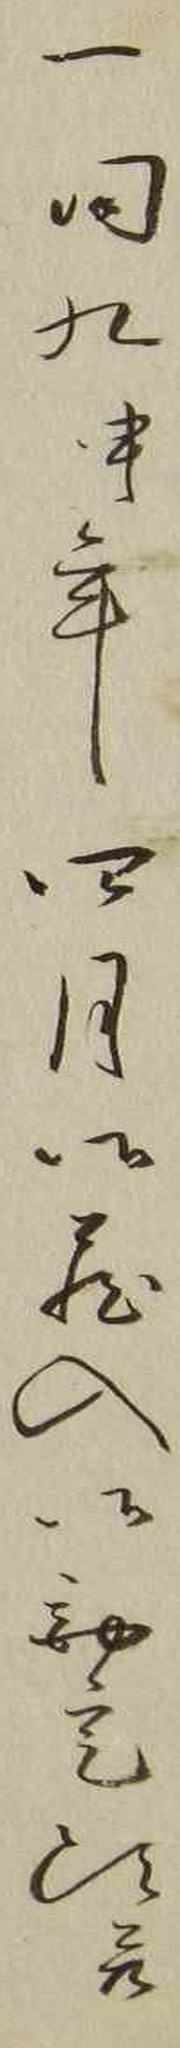一同九申年四月御蔵入御勘定頭并
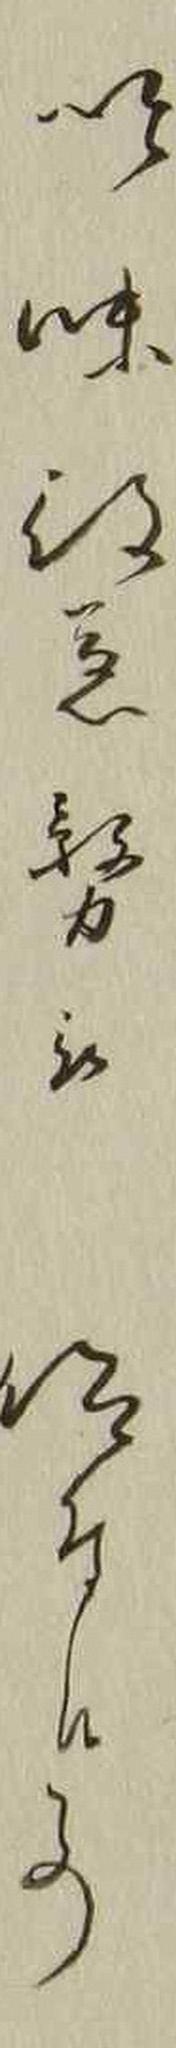吟味役兼務被仰付候事
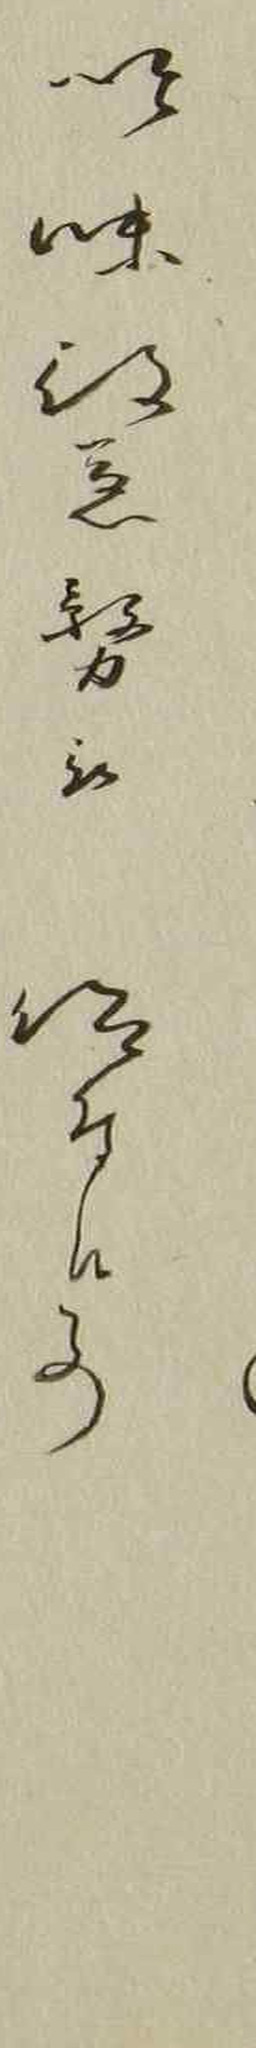吟味役兼務被仰付候事
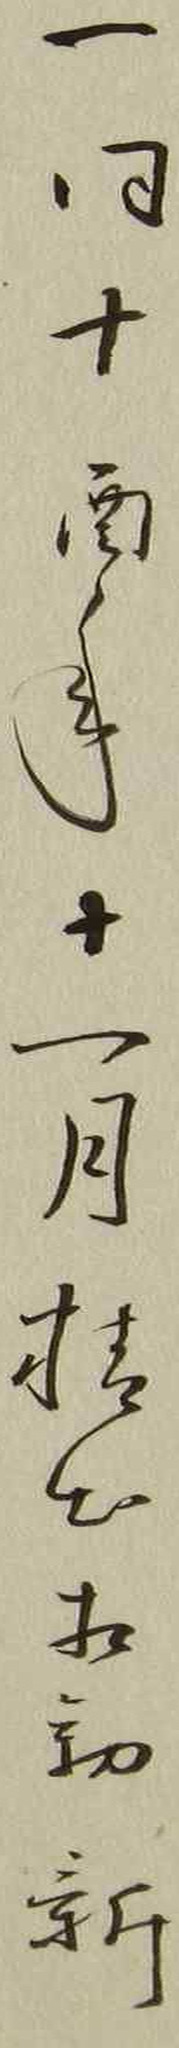一同十酉年十一月精出相勤新
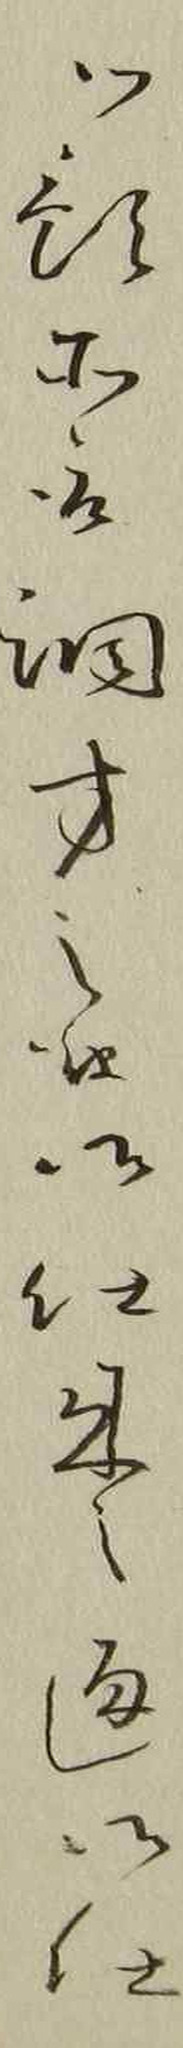御預所取調方之儀御仕来之通御仕
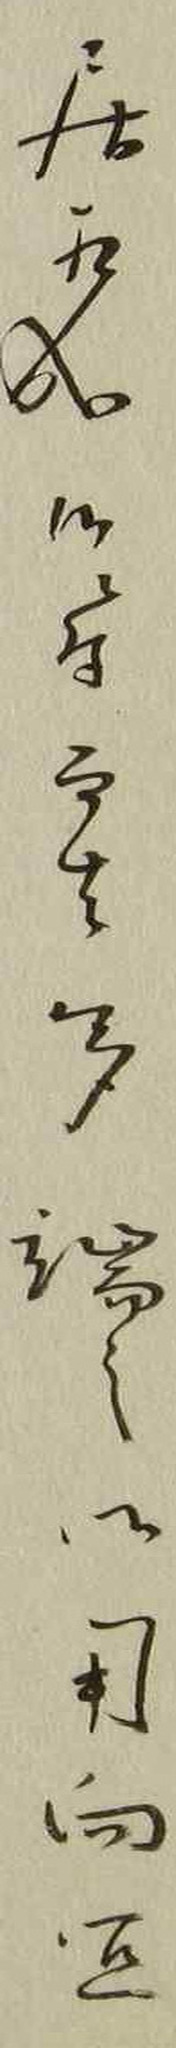居相成候ニ付而者多端之御用向宜
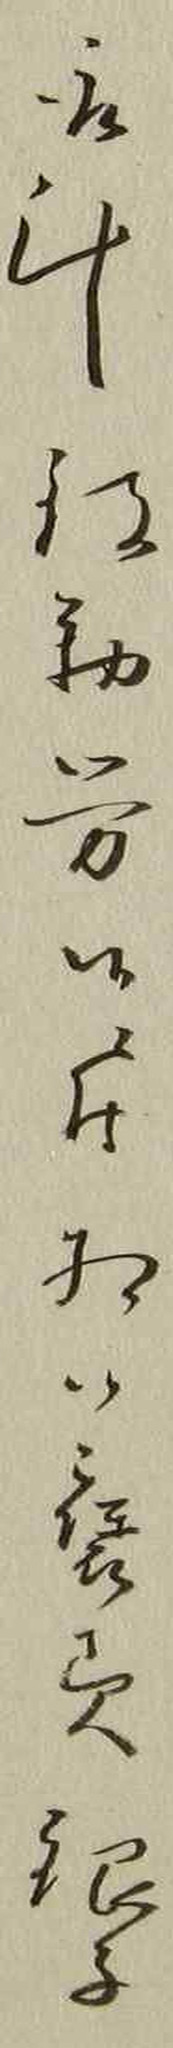取計致勤労候ニ付為御褒美銀子
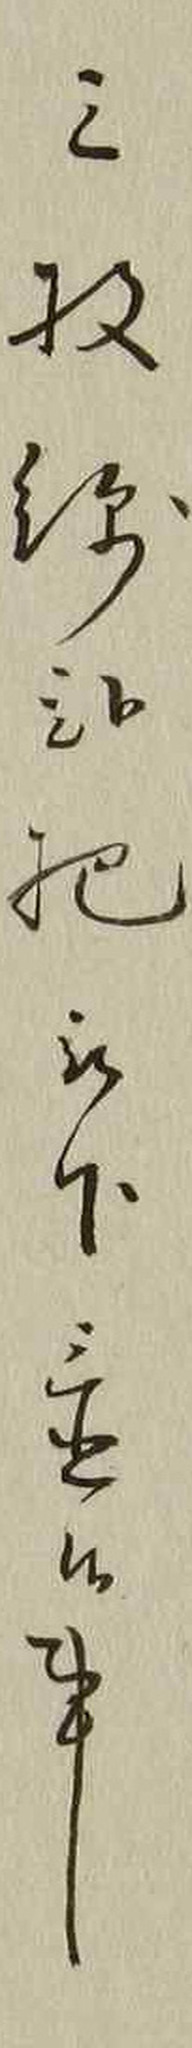三枚綿弐把被下置候事
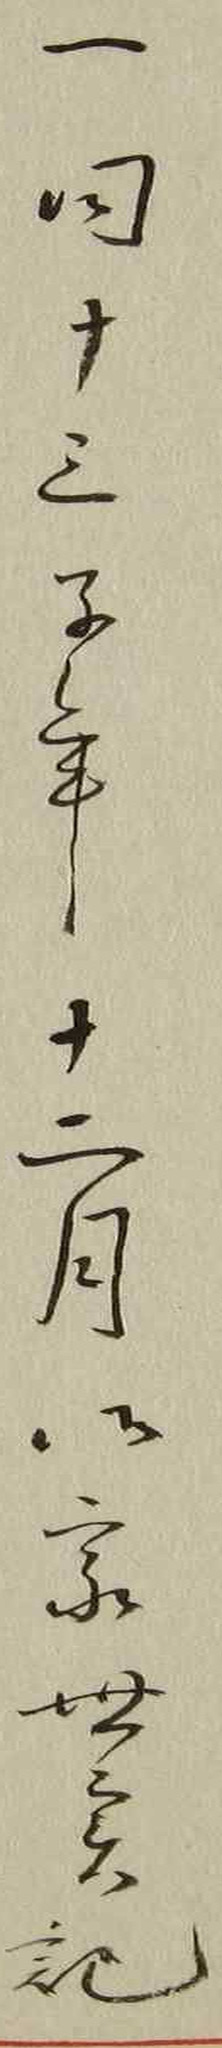一同十三子年十二月御家世実記
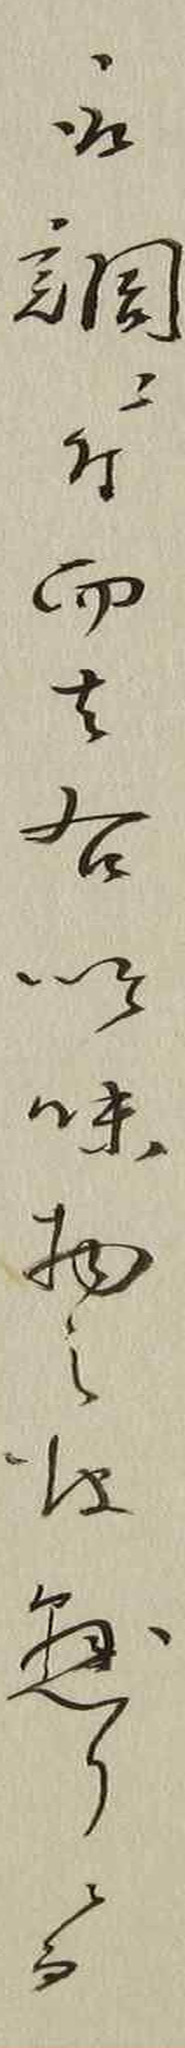取調ニ付而者右吟味物之儀懸りニ而
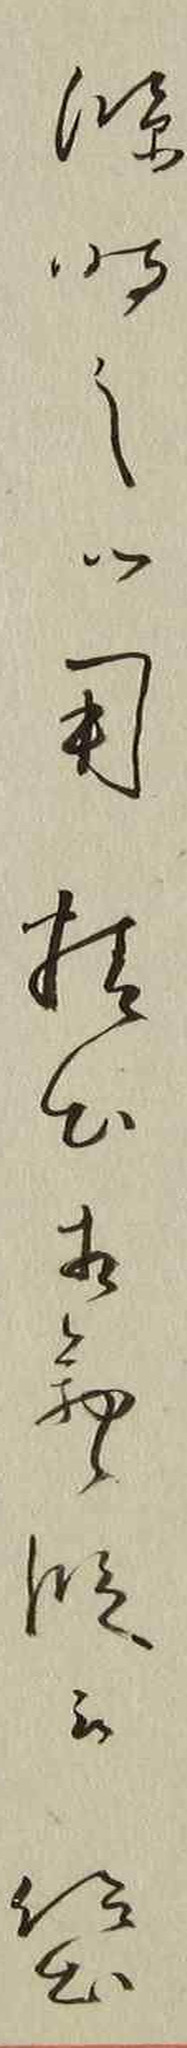臨時之御用精出相勤候段被仰出
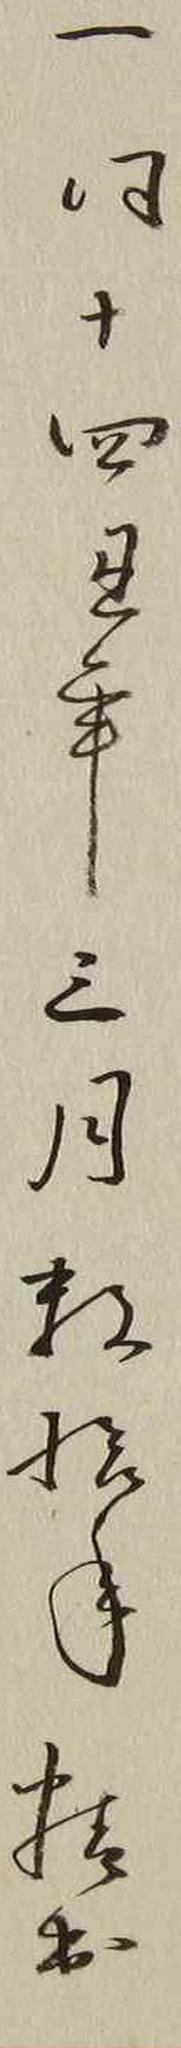一同十四丑年三月数拾年精出
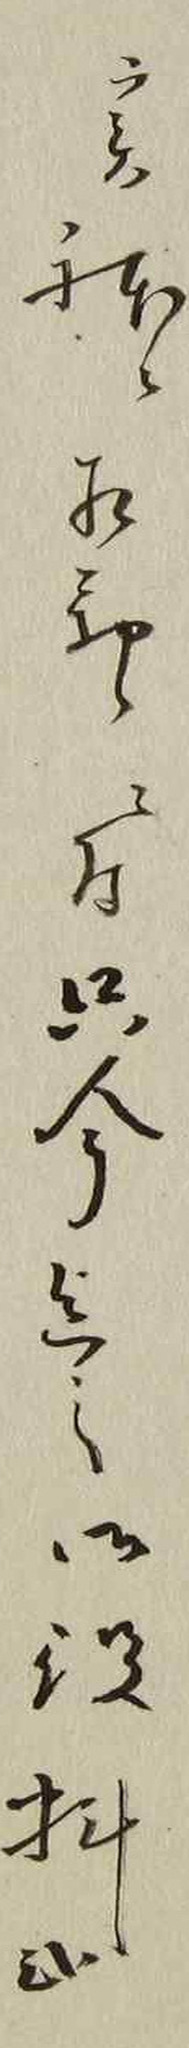実体ニ相勤候ニ付只今迄之御役料弐
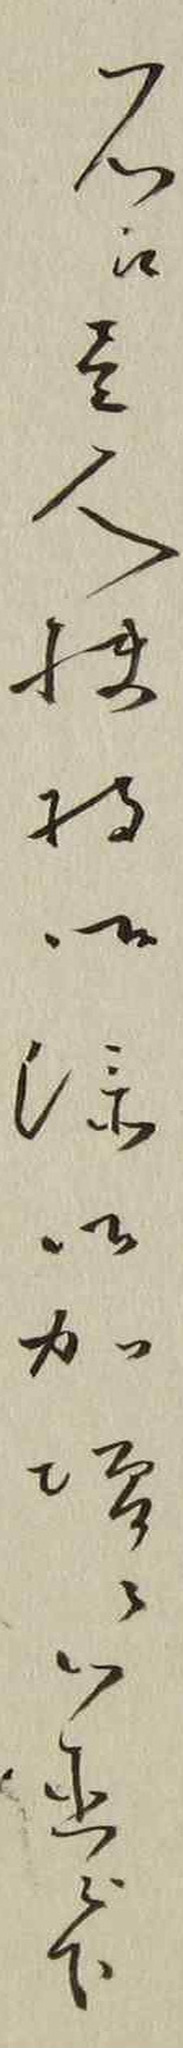石江壱人扶持御添御加増ニ御直被下
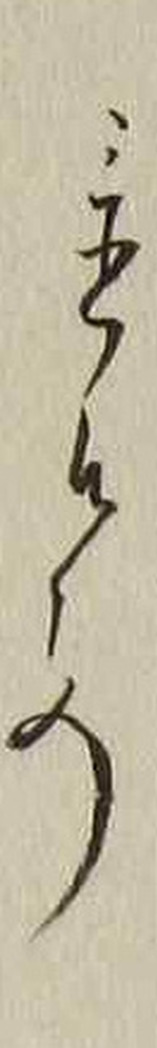置候事
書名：諸士系譜　巻之8　い之部8
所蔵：会津若松市立会津図書館
